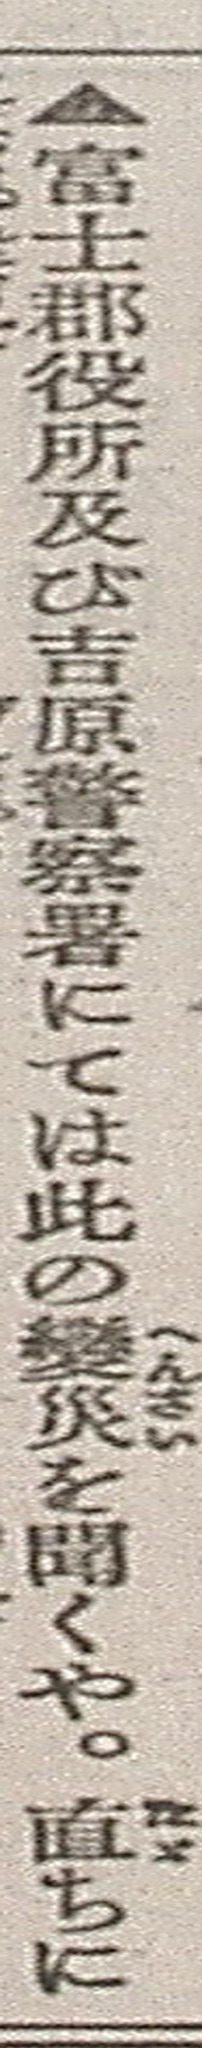▲富士郡役所及吉原警察署にては此の変災を聞くや。直ちに
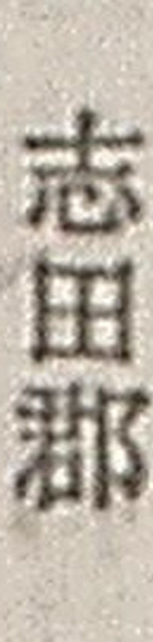志田郡
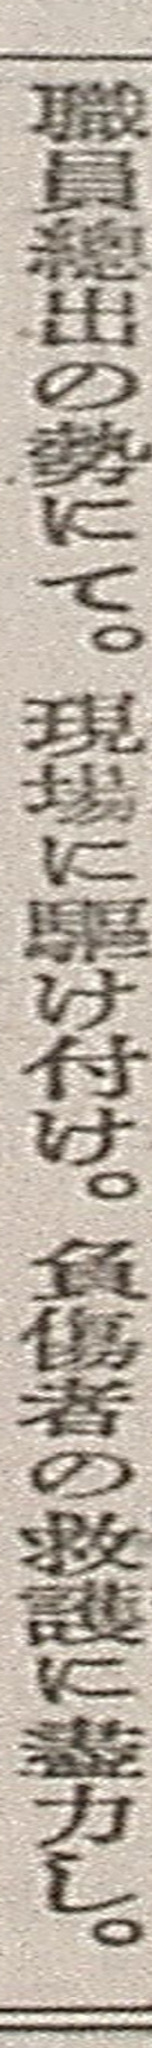職員総出の勢にて。現場に駆け付け。負傷者の救護に尽力し。
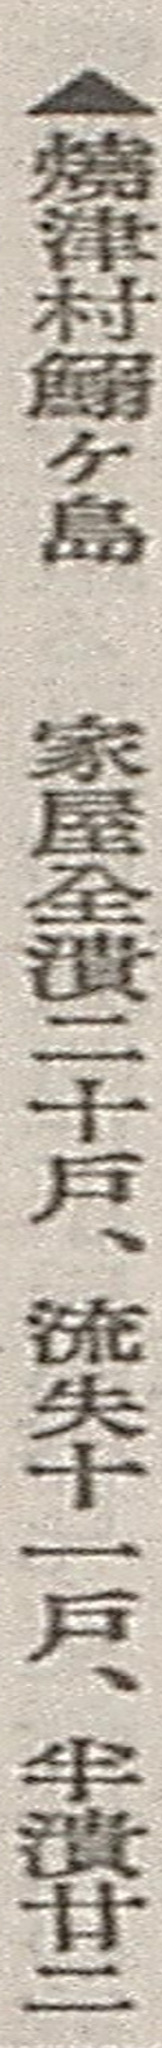▲焼津村鰯ケ島家屋全潰二十戸、流失十一戸、半潰廿二
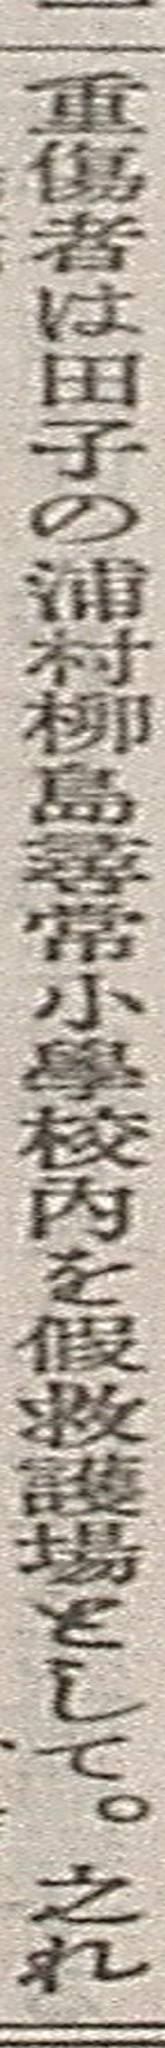重傷者は田子の浦村柳島尋常小学校内を仮救護場として。之れ
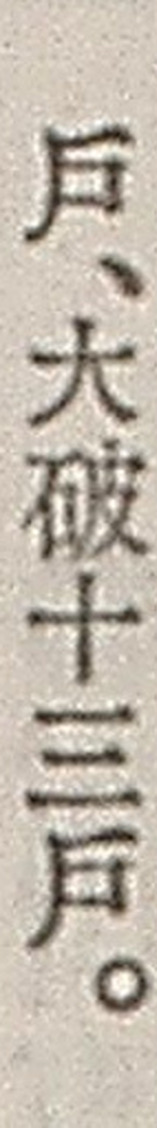戸、大破十三戸。
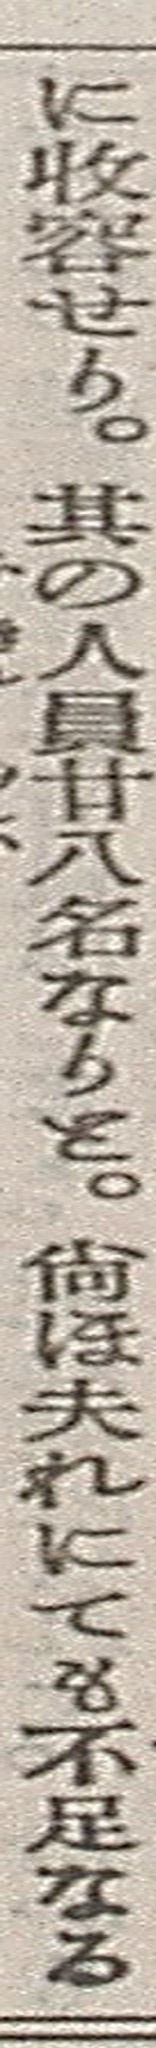に収容せり。其の人員廿八人なりと。尚ほ夫にても不足なる
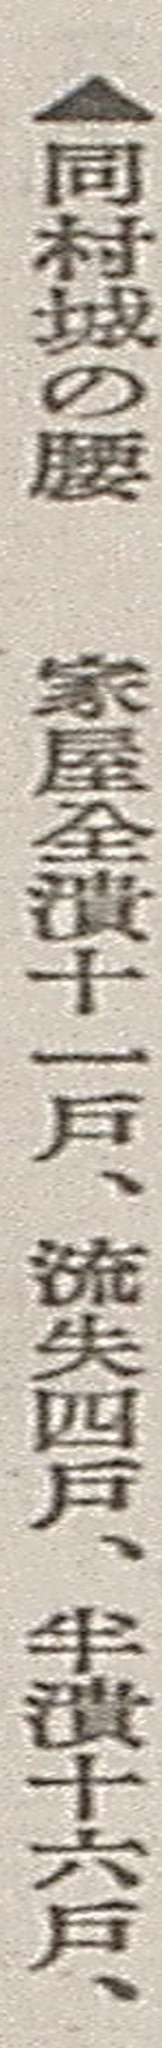▲同村城の腰家屋全潰十一戸、流失四戸、半潰十六戸、
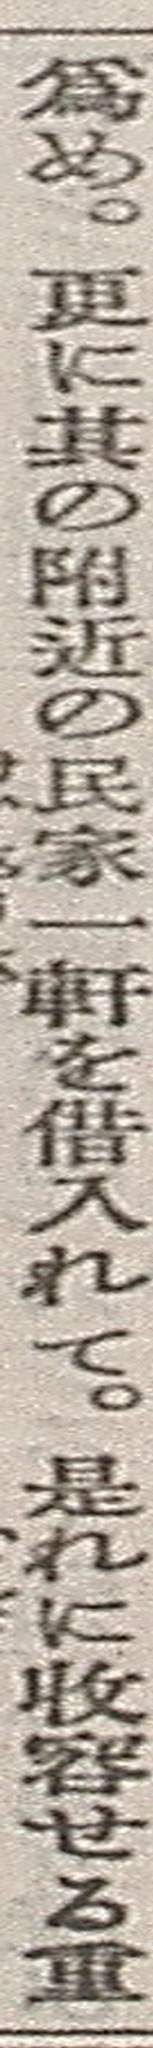為め。更に其の附近の民家一軒を借入れて。是れに収容せる重
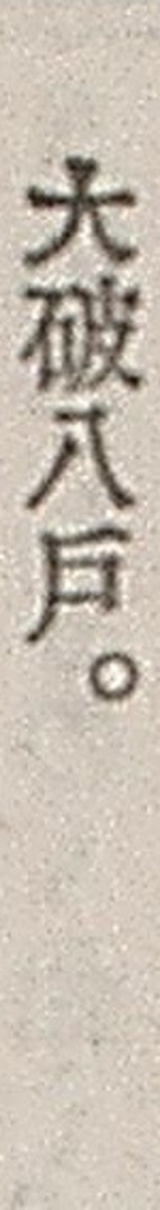大破八戸。
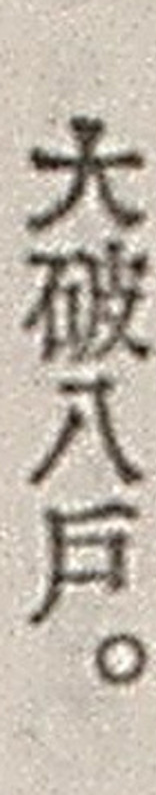大破八戸。
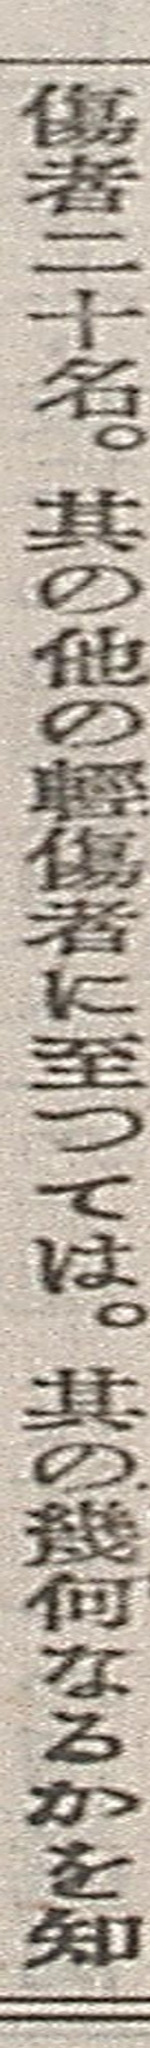傷者二十名。其の他の軽傷者に至つては。其の幾何なるかを知
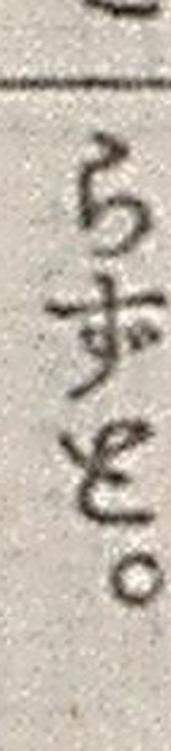らずと。
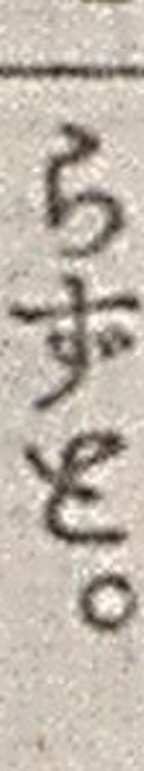らずと。
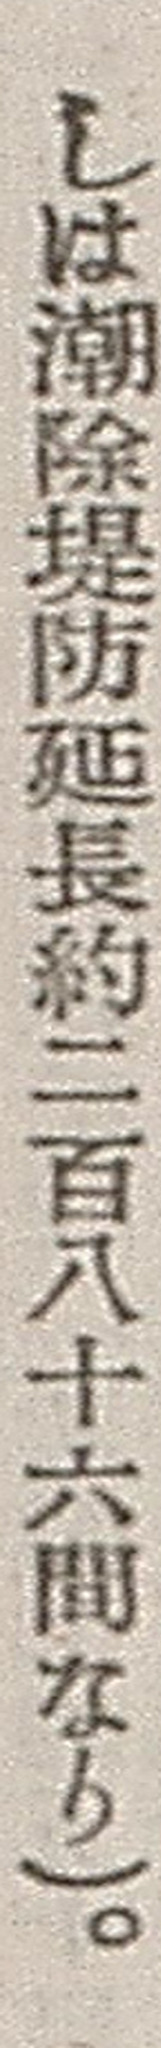しは潮除堤防延長約二百八十間なり）。
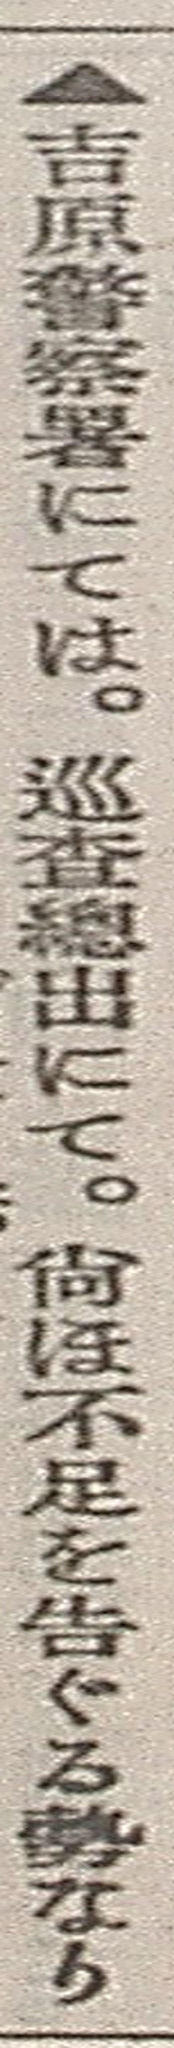▲吉原警察署にては。巡査総出にて。尚ほ不足を告ぐる勢なり
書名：風俗畫報臨時増刊第百九十九號　明治三十二年十月各地災害圖會（前編之續）
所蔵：東京大学地震研究所図書室 Earthquake Research Institute Library, The University of Tokyo, JAPAN
